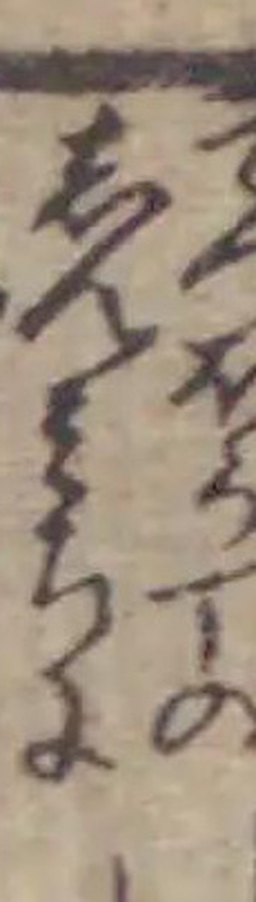しんみちに
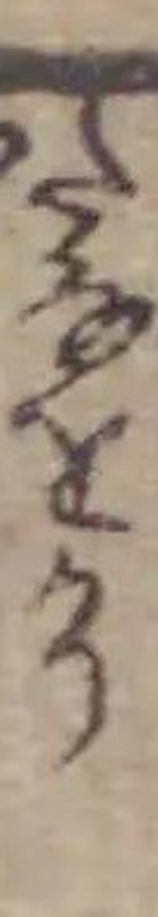たなをかり
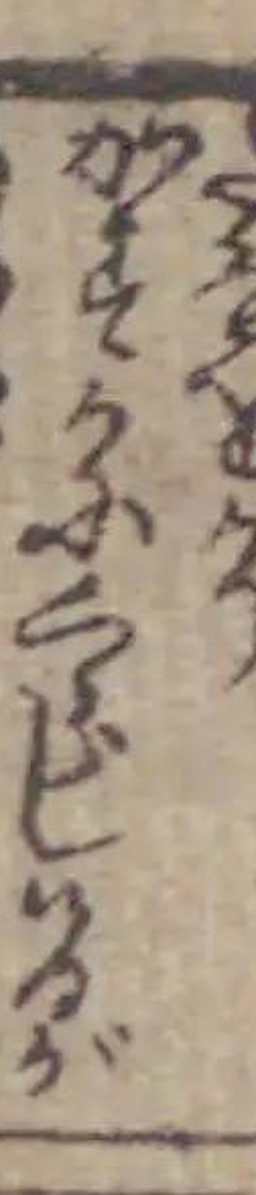かすかにくらしけるが
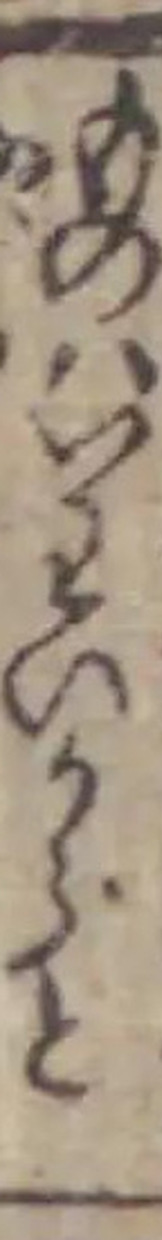ものはいわいからと
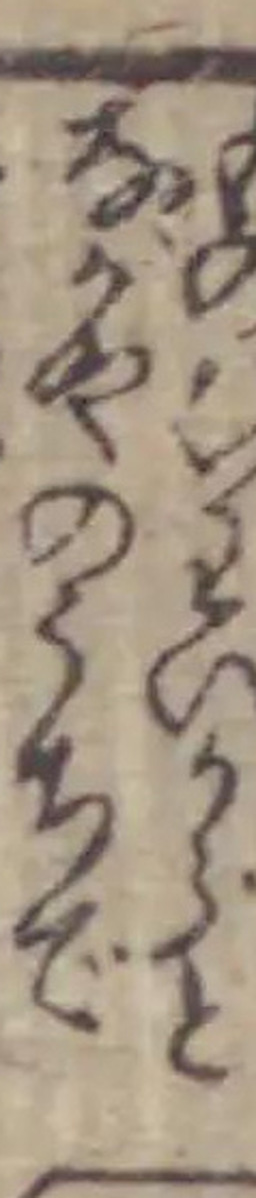なかやのうちで
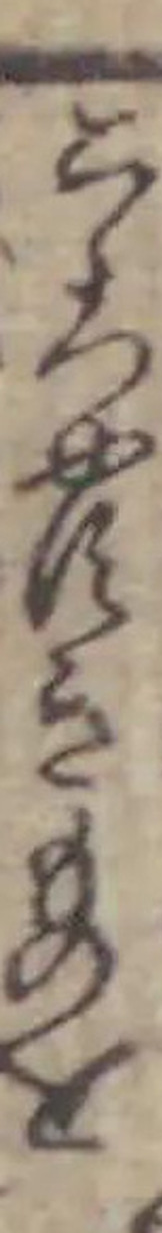こゝろやすきものを
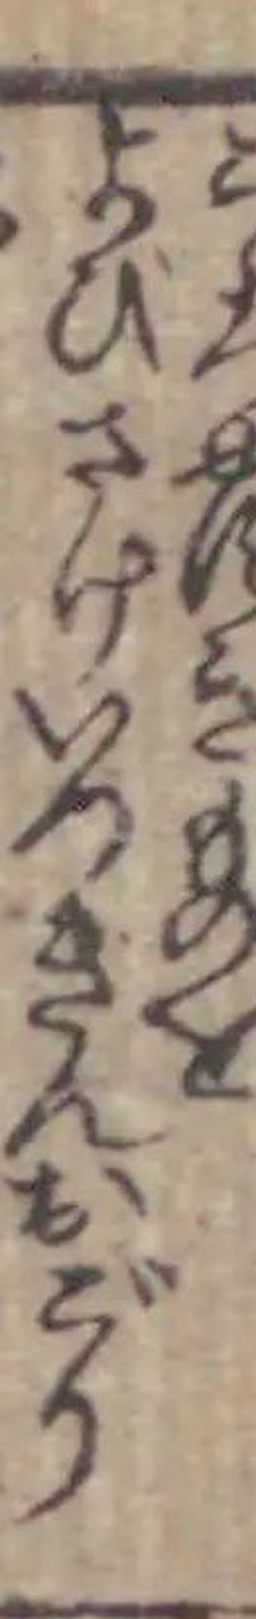よびさけいつきんおごり
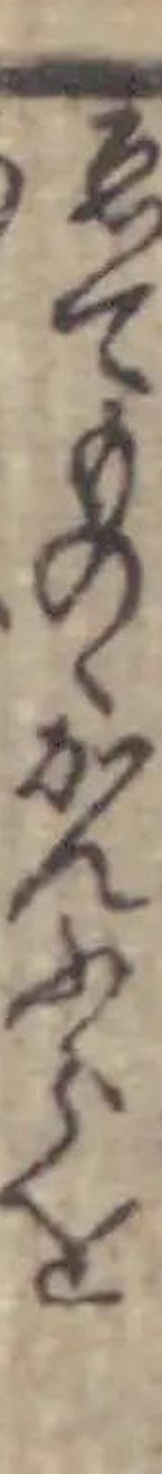ゑてものゝかんふらを
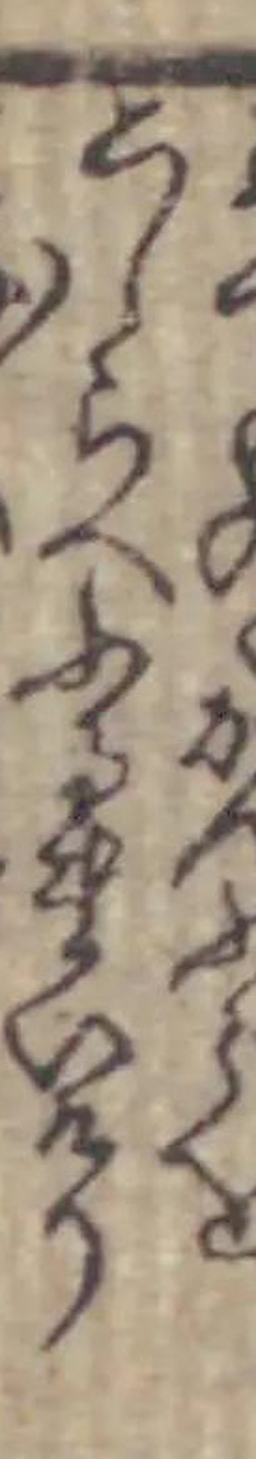こしらへふるまいけり
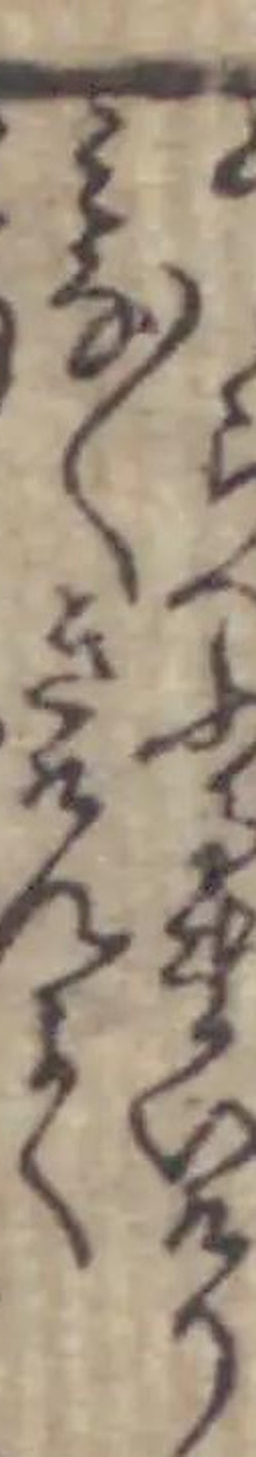みな〳〵きけんよく
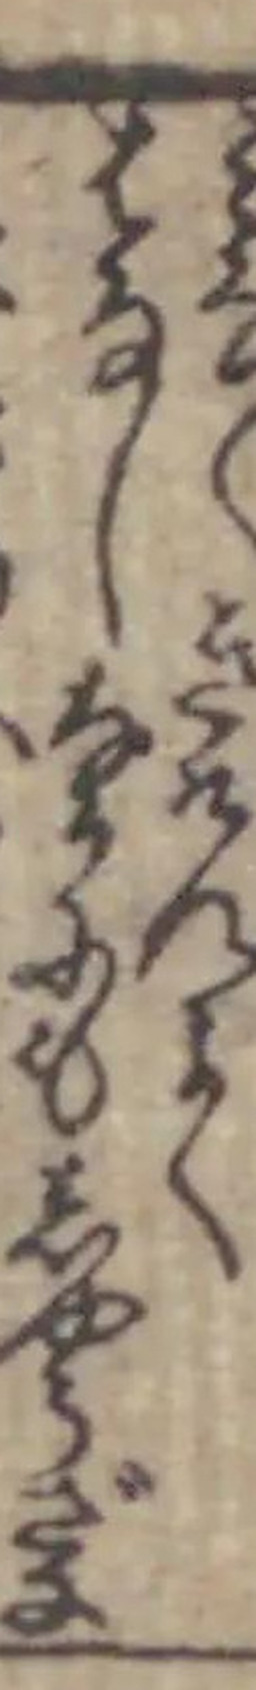はなしなかにもしやうざに
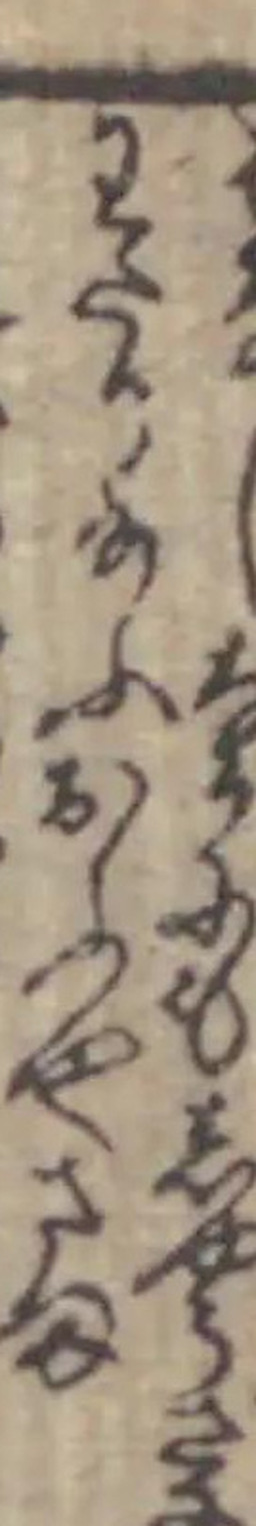わたり給ふおふやさま
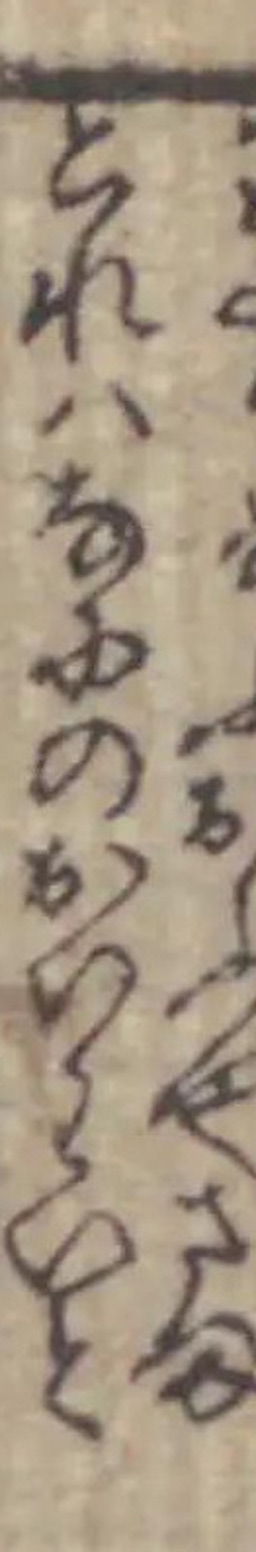これはなにのおいわいと
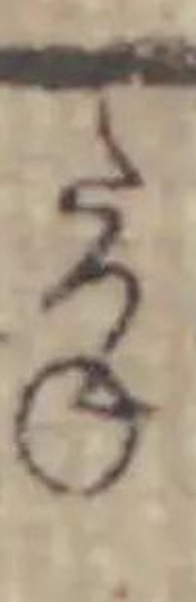たつね
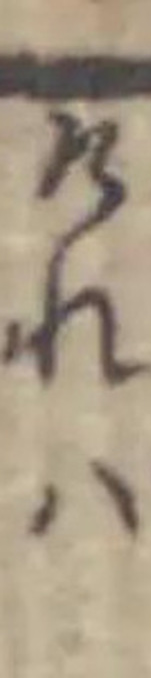けれは
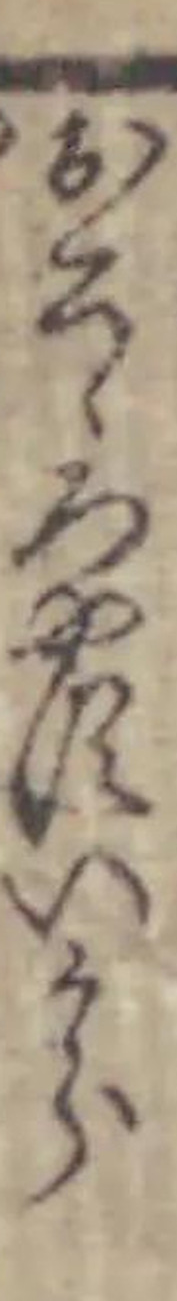おこゝろやすいから
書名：間違月夜鍋 2巻
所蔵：国立国会図書館 National Diet Library, JAPAN
